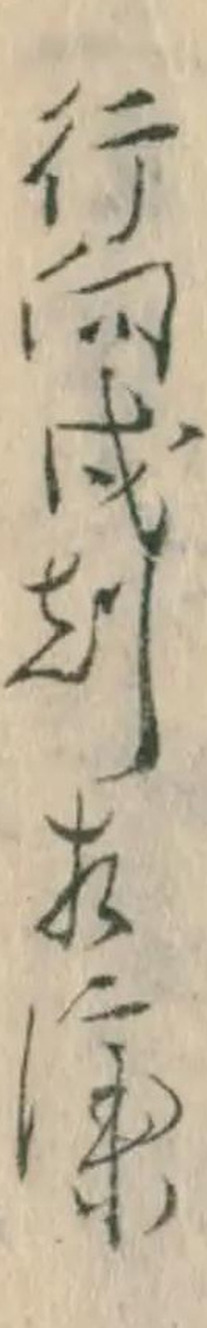行向戌刻相添
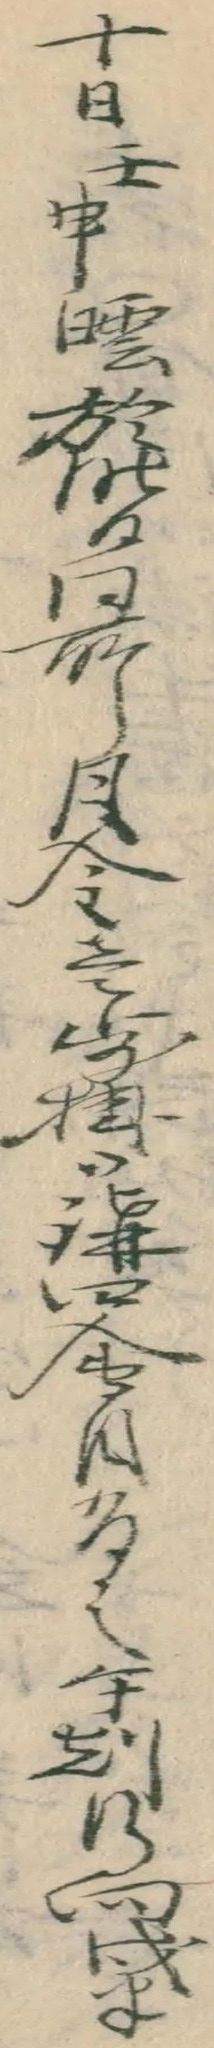十日壬申曇於昨日同所金壱歩掛御講四會目有之午刻行向戌半

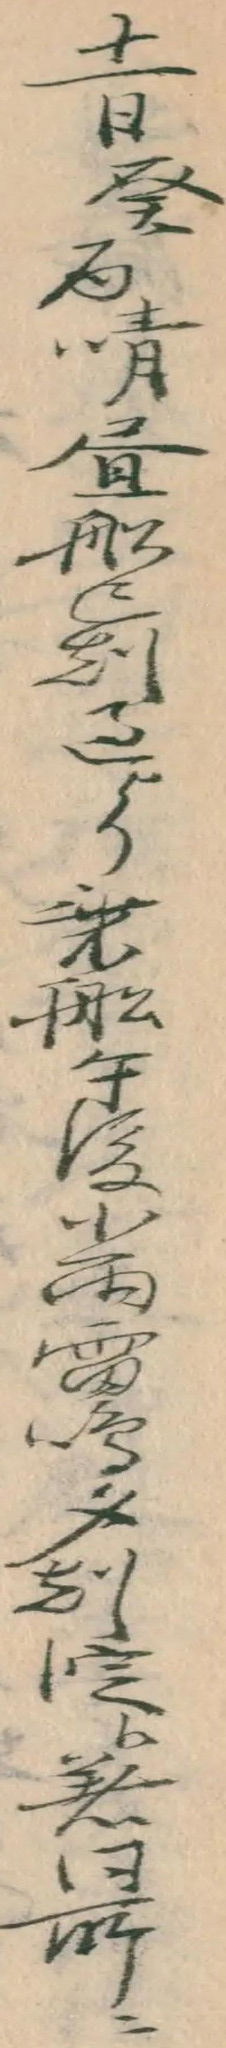十一日癸酉晴昼舩巳刻過より乗舩午後小雨雷鳴夕刻淀え着同所ニ
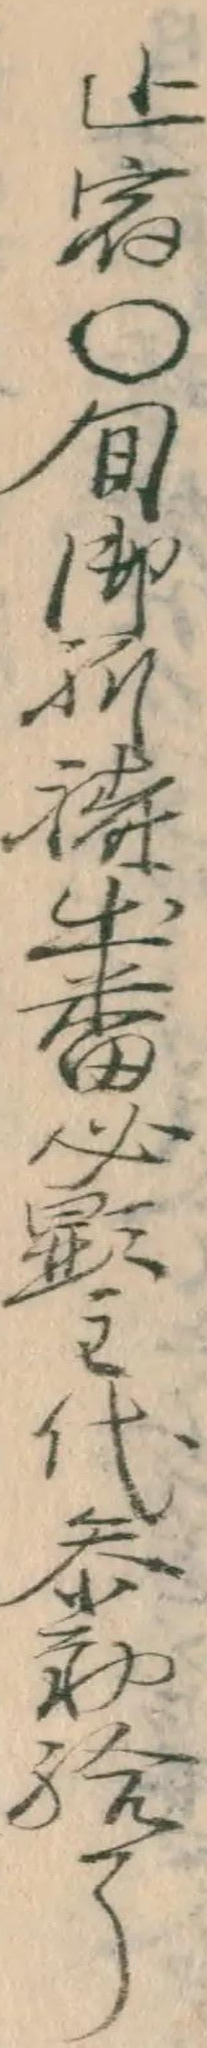止宿○旬御祈祷出番必顕主代参勤給了
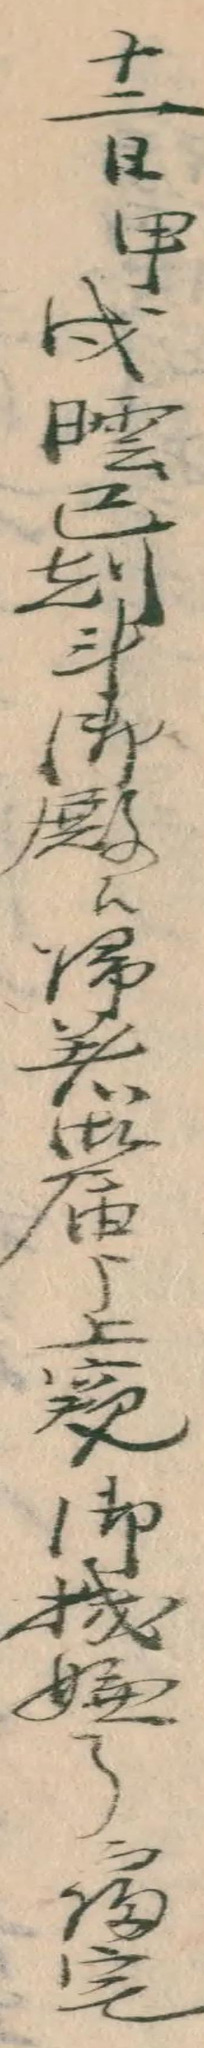十二日甲戌曇巳刻斗御殿え帰着御届申上窺御機嫌了而帰宅
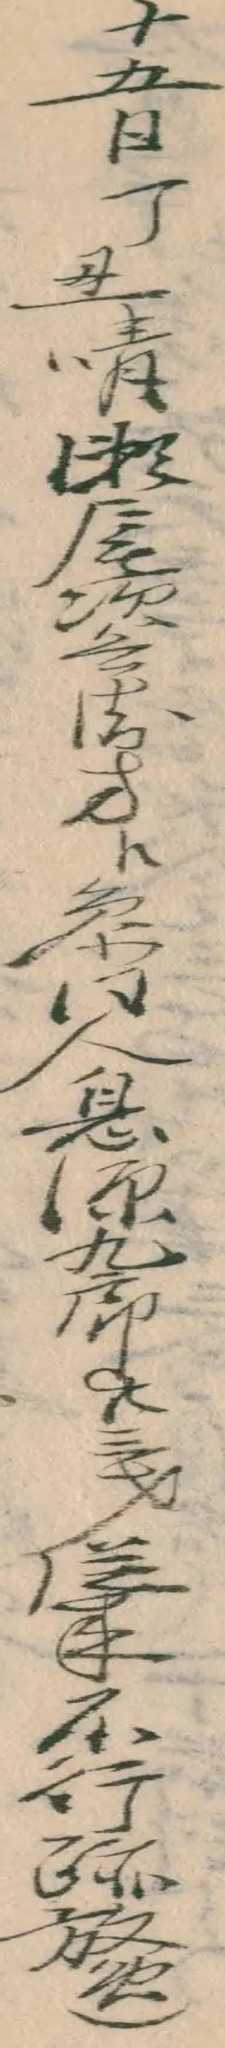十五日丁丑晴瀬尾次兵衛方え参同人息源九郎廿三才従来不行跡欲逸
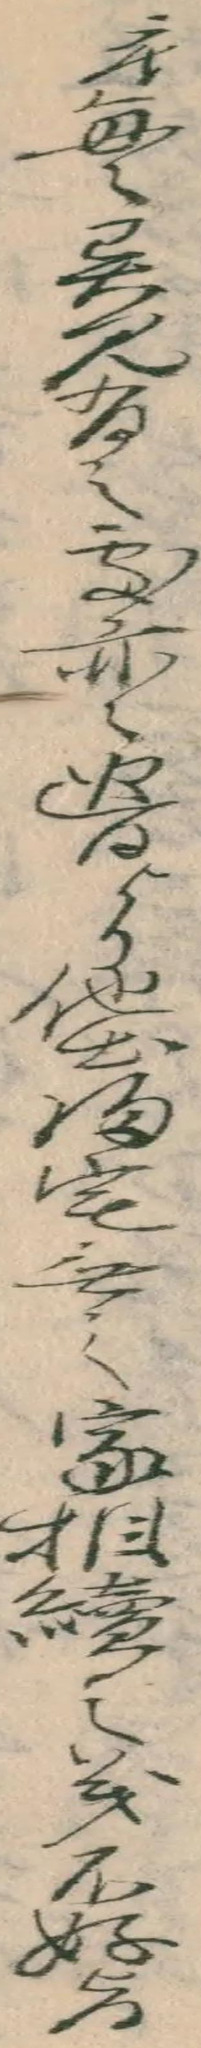ニ付毎々異見有之處亦々過日より他出帰宅無之家相續之義不好旨
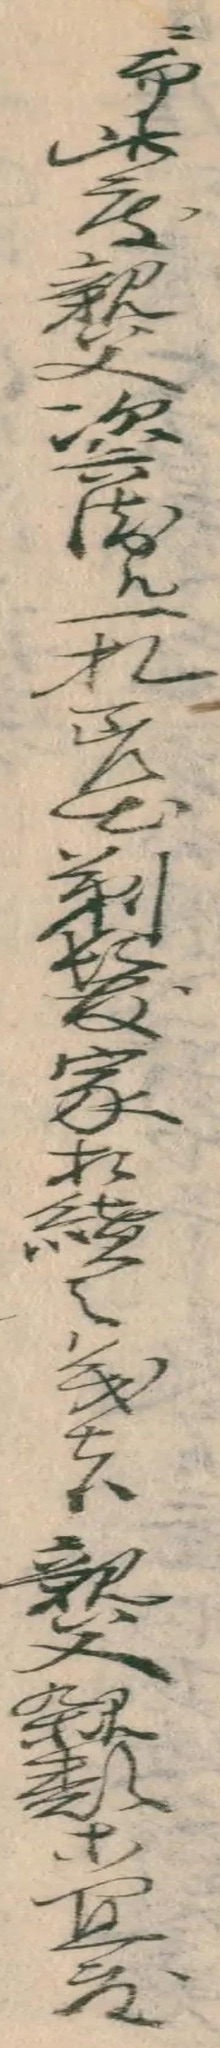ニ而此度親父次兵衛え一札差出剃髪家相續之義は親父親類等宜敷
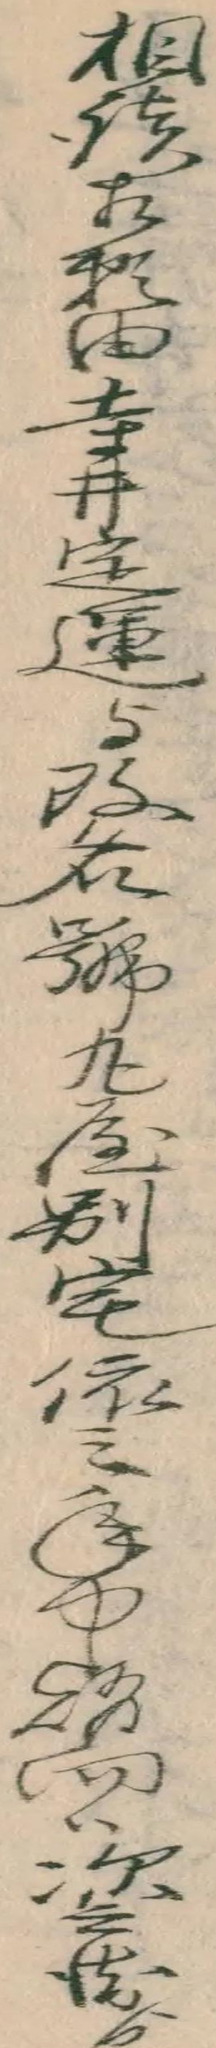相談相頼由寺井定運と改名號丸屋別宅依之年中賄向ハ次兵衛ゟ
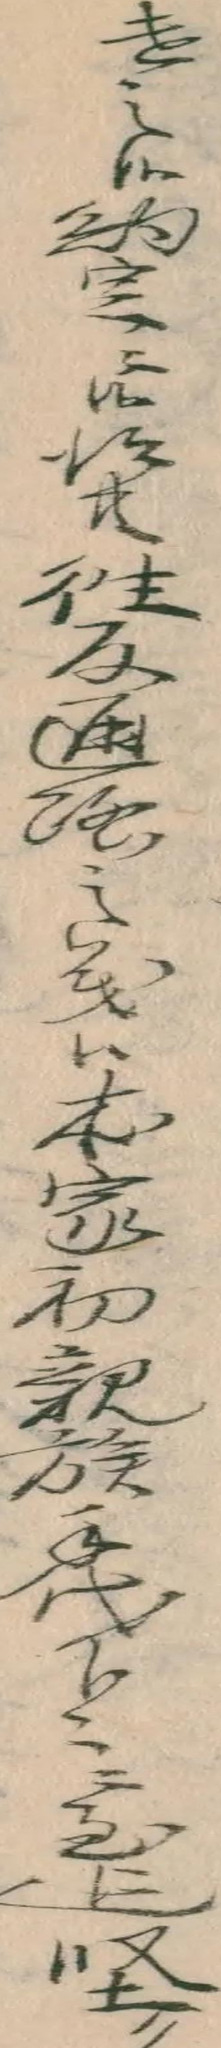遣之候約定ニ候得共往反通路之義ハ本家初親族手代下々に至迄堅ク
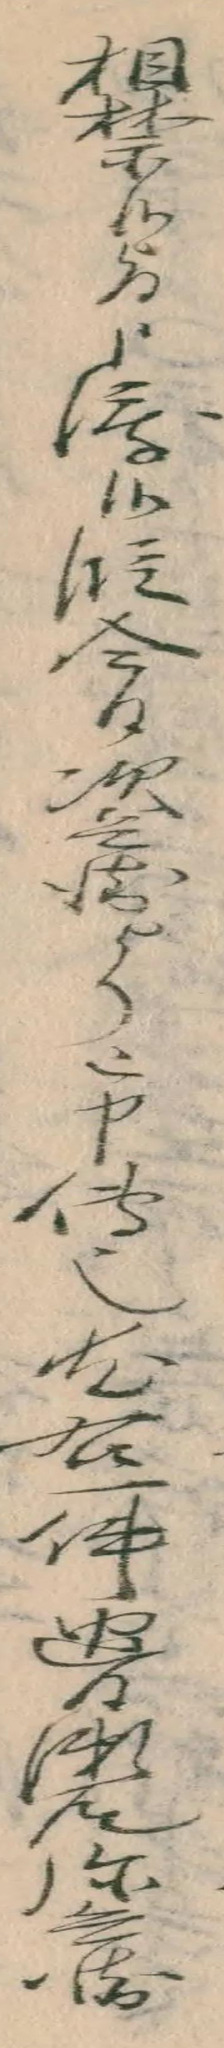相禁候旨申渡候段今日次兵衛より被申傳也尤右一件過日瀬尾弥兵衛
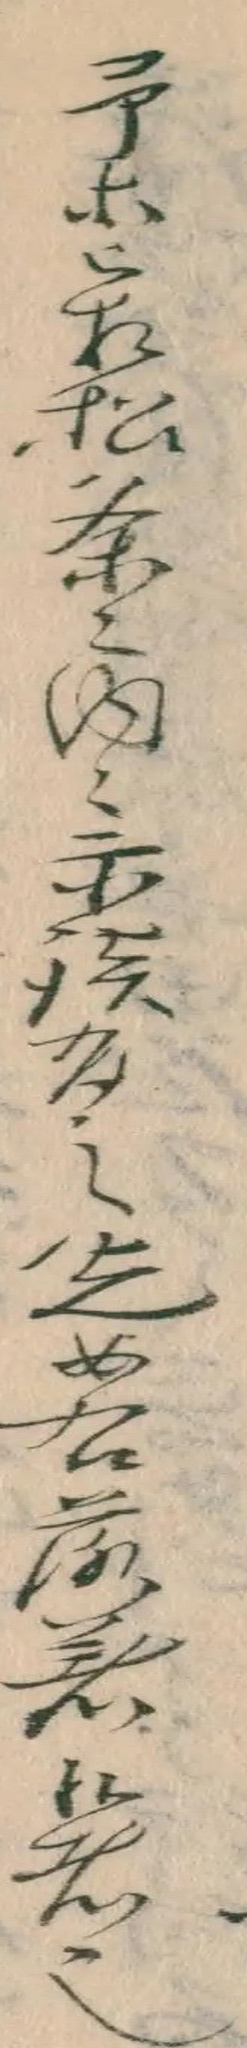予等被相招条々内々示談有之先如右落着候者也
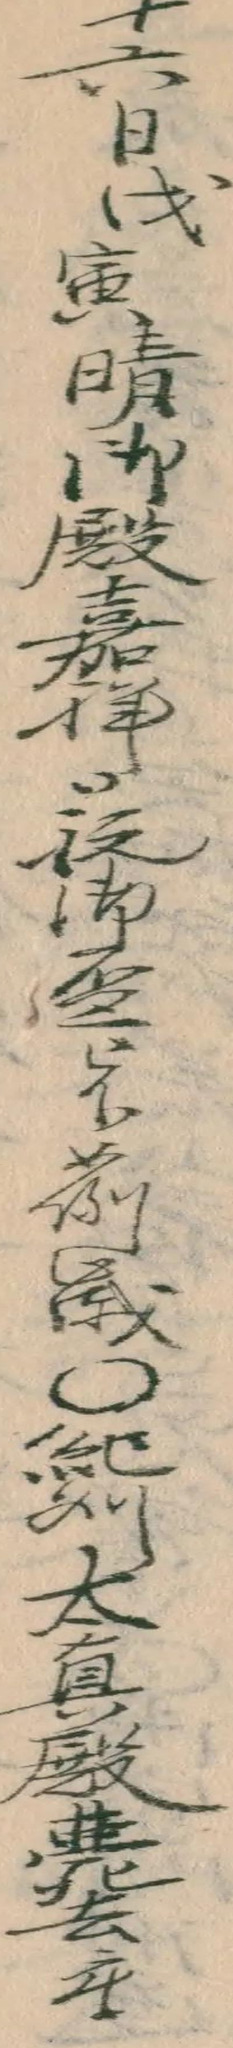十六日戊寅晴御殿嘉祥御祝御盃被下如例歳〇紀州太真殿薨去ニ付
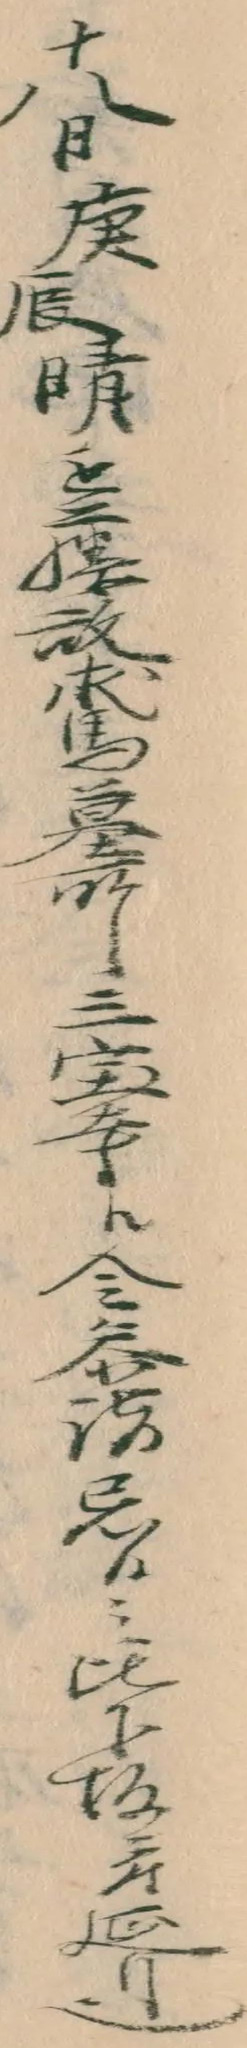十八日庚寅晴近二故求馬墓所三宝寺え令参詣忌候之比下坂ニ付延引也
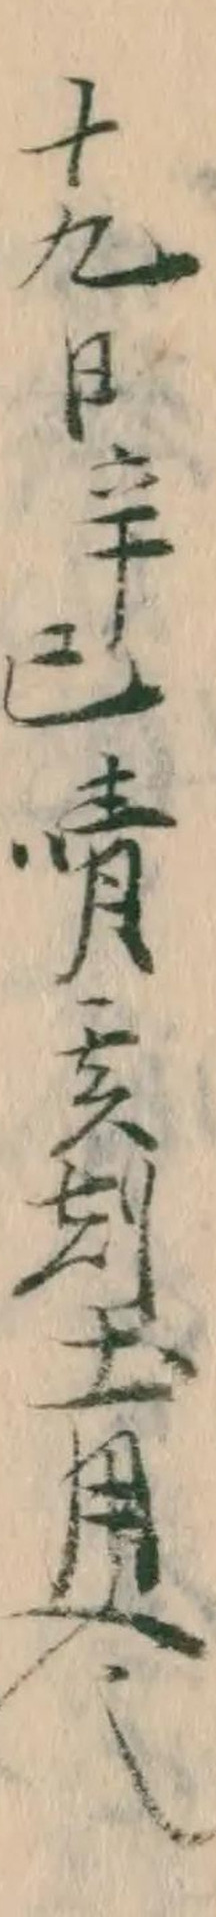十九日辛巳晴亥刻土用入也
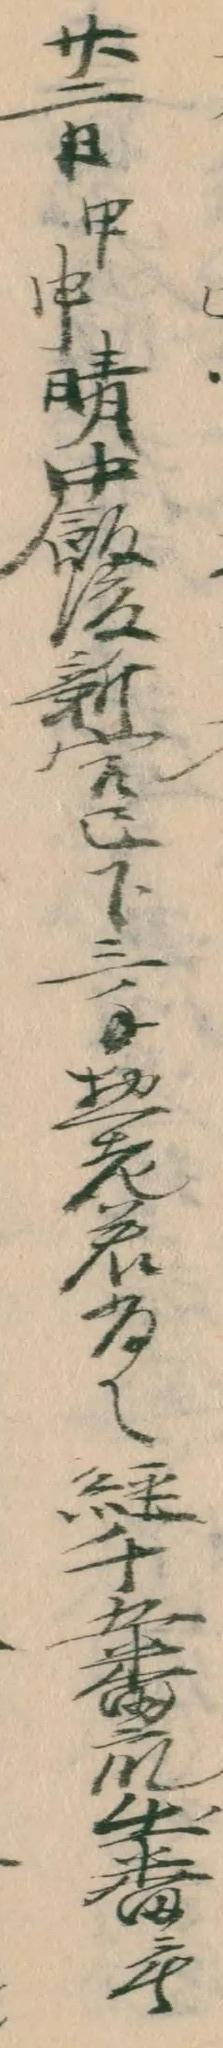廿二日甲申晴中飯渡新宮已下三手惣老若有之経千五番衆出番ニ付
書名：賀茂社記録. 第65冊
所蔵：国立国会図書館 National Diet Library, JAPAN
